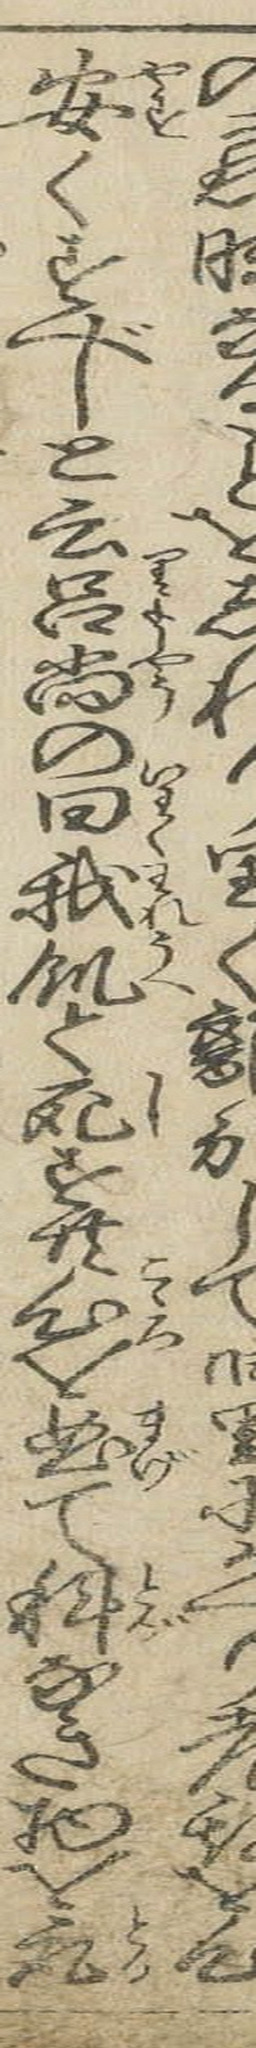安くすべしと云呂尚の曰我飢て死す共心を曲て科なき物を取
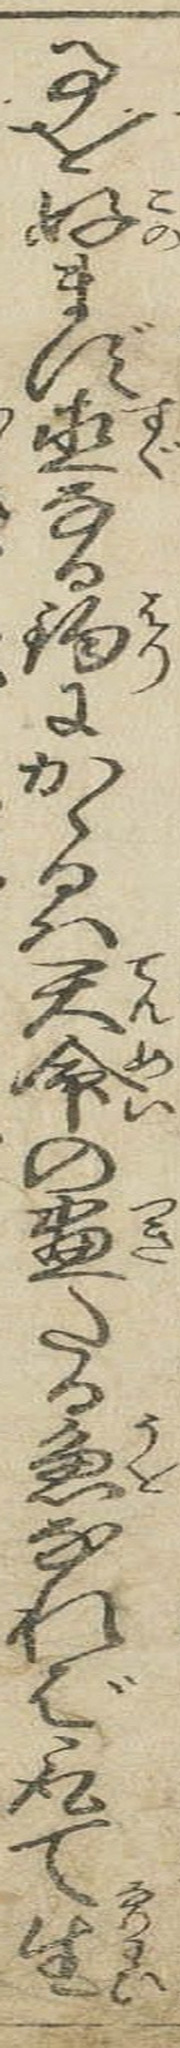事を好まず直なる鉤にかゝるは天命の尽たる魚なれば取て生
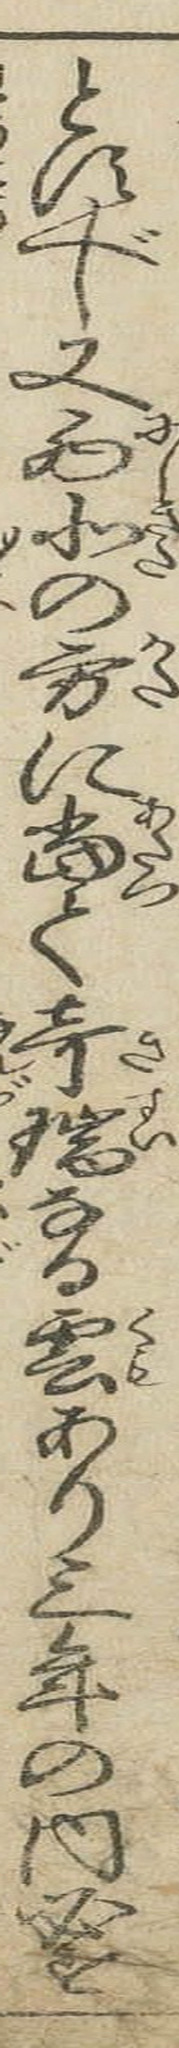とすべし又西北の方に当て奇瑞なる雲あり三年の内必す
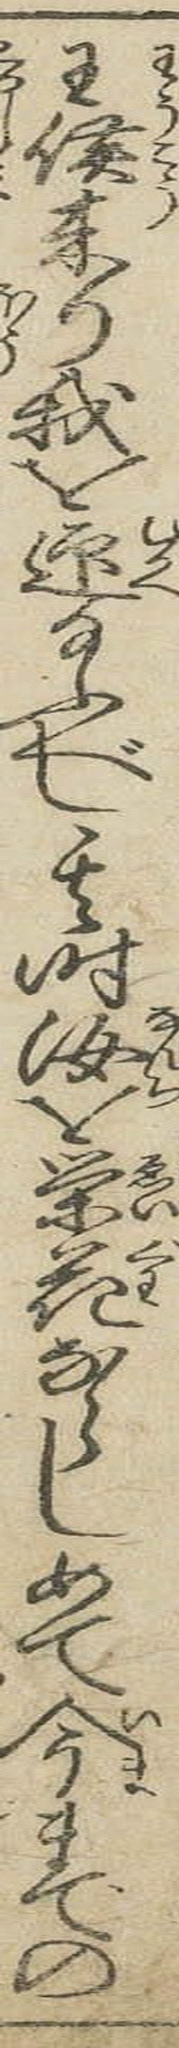王侯来り我を迎給ふべし其時汝を栄花ならしめて今までの
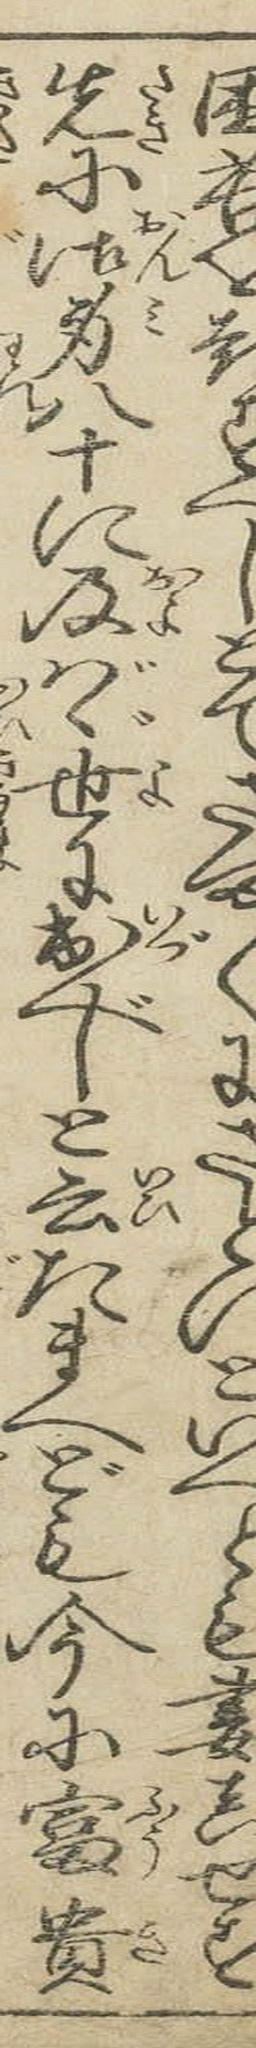先に御身八十に及ばゞ世に出べしと云たまへども今に富貴
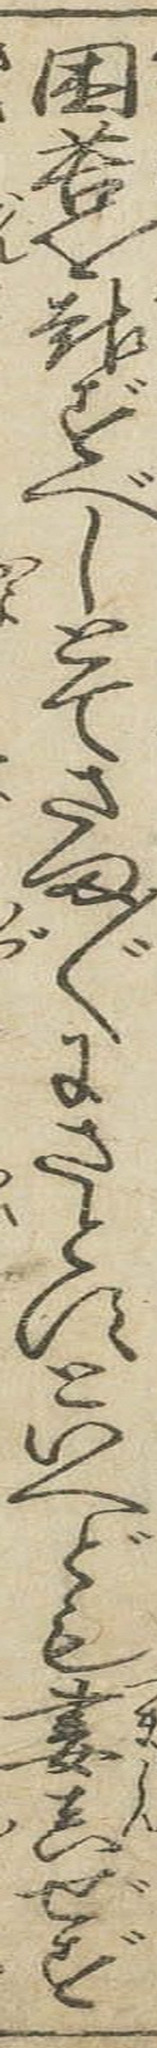困苦を報ずべしとてさま〴〵にさとすといへども妻真ぜず
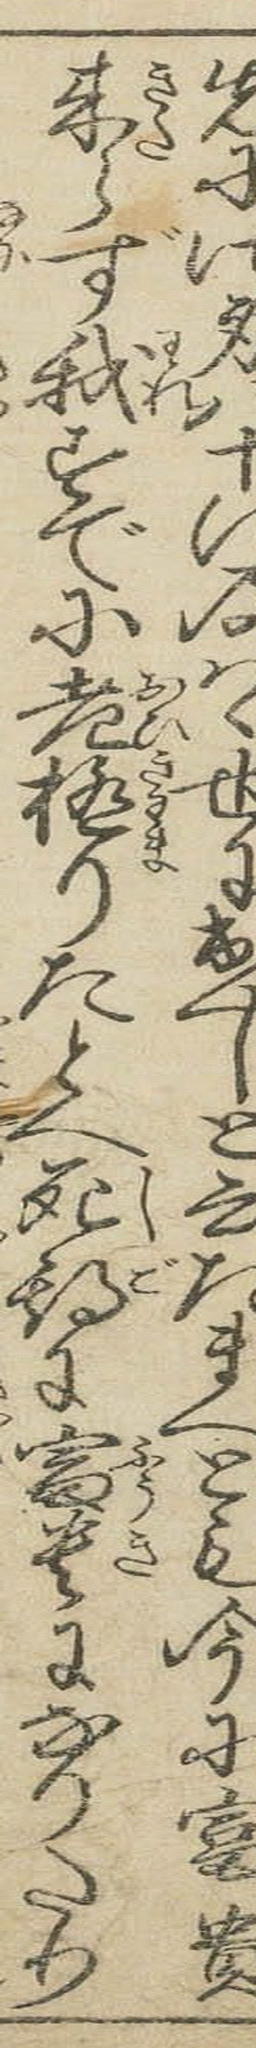来らず我すでに老極りたとへ死期に富貴になりたり
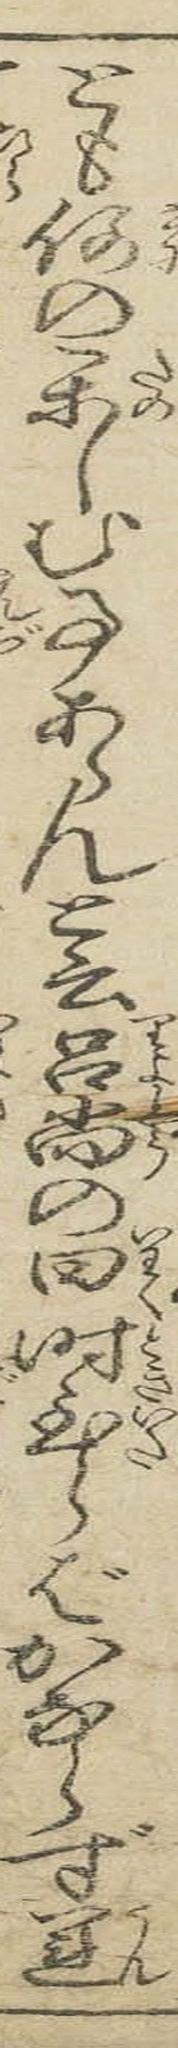とも何の楽しむ事あらんと云呂尚の曰時至らばかならず運
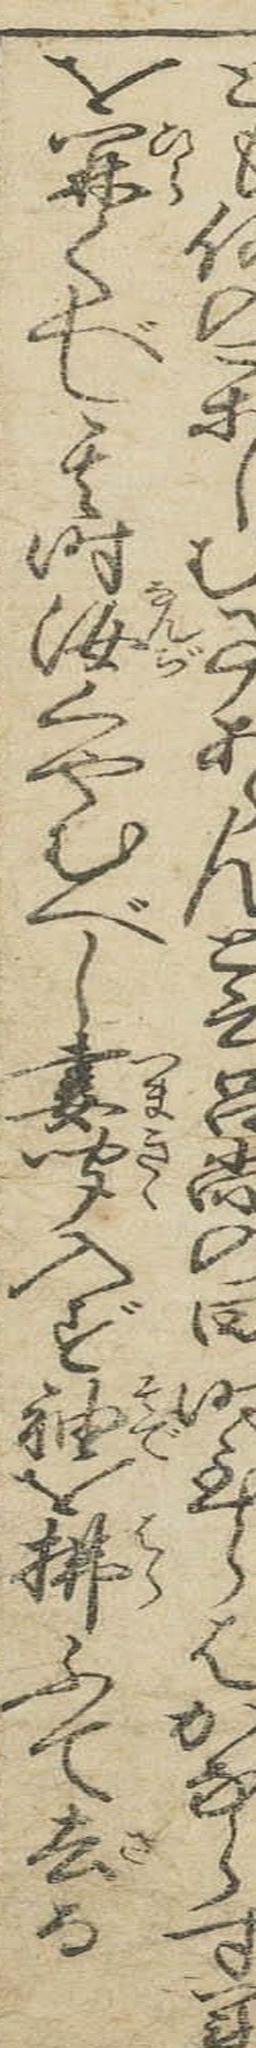を開くべし其時汝くやむべし妻聞入ず袖を払ふて去る
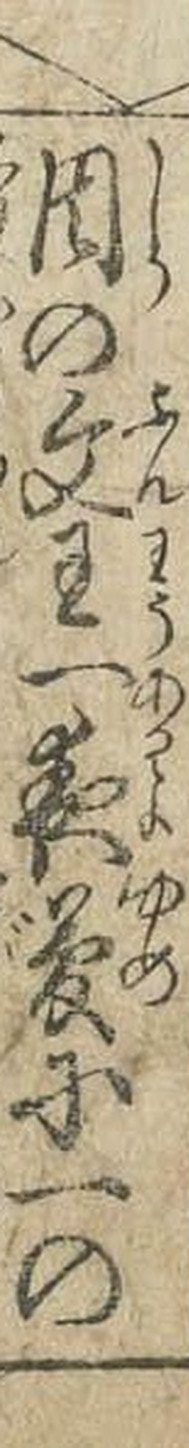周の文王一夜夢に一の
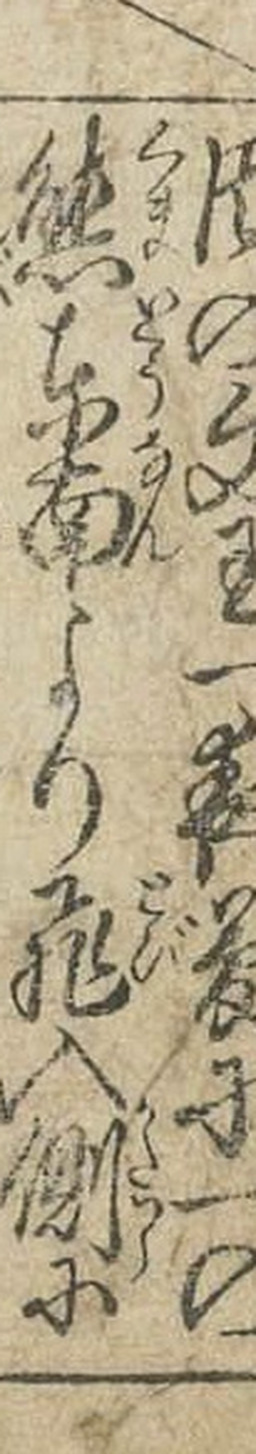熊東南より飛入側に
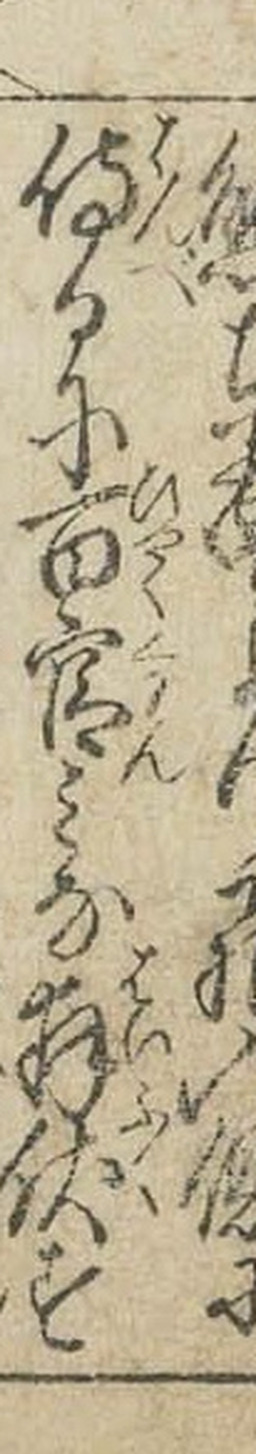侍るに百官みな拝伏す
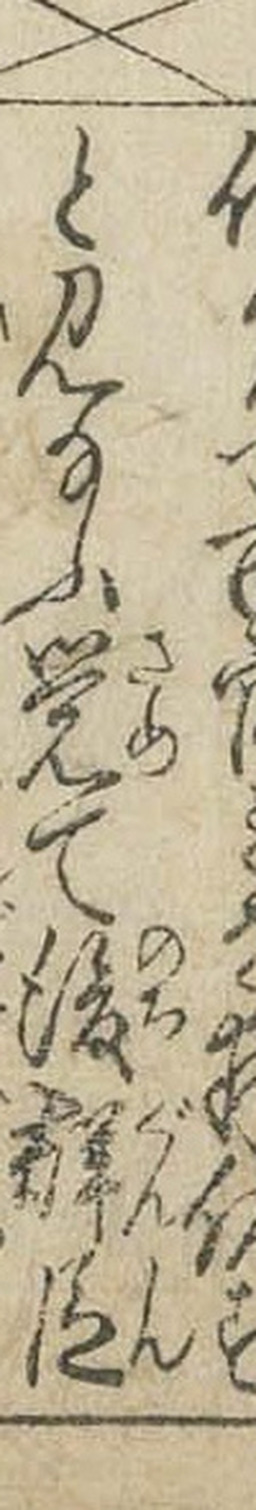と見給ふ覚て後群臣
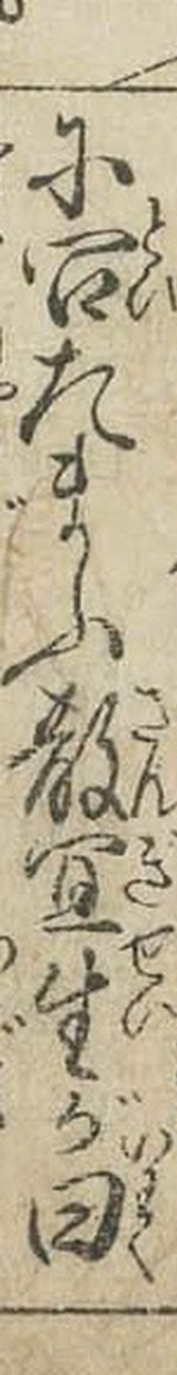に問たまふ散宜生が曰
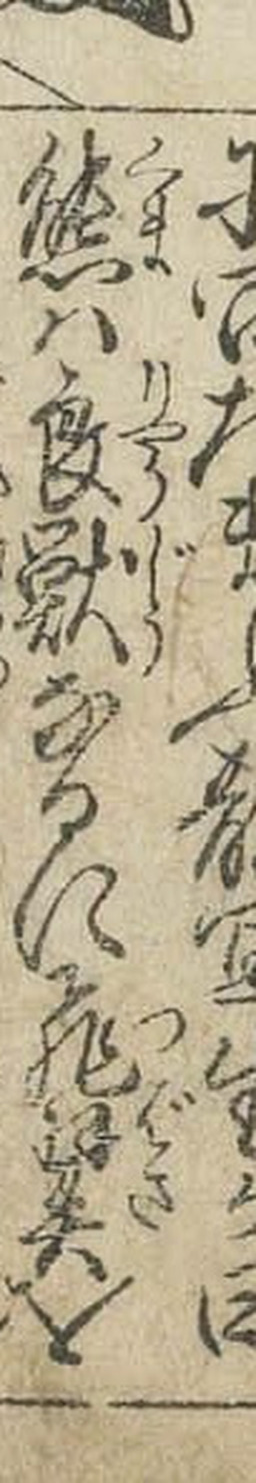熊は良獣なるに飛翼を
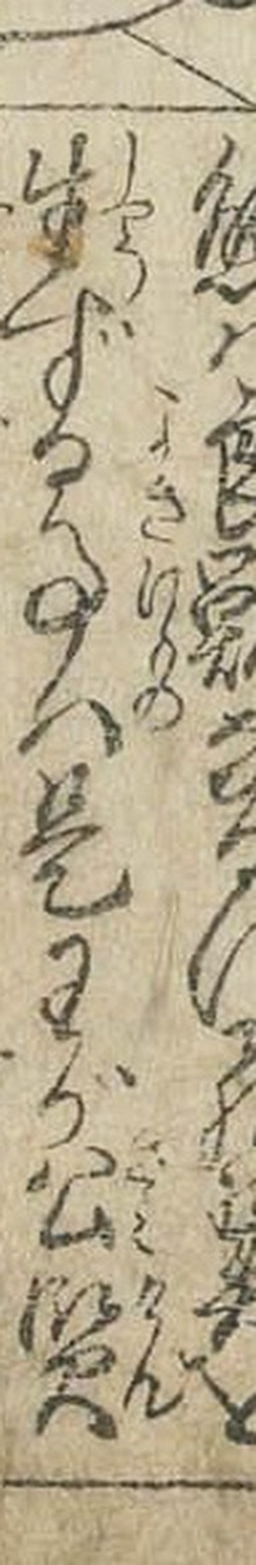生ずる事は是わが公賢
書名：絵本写宝袋 9巻 4之巻
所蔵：東京学芸大学教育コンテンツアーカイブ
